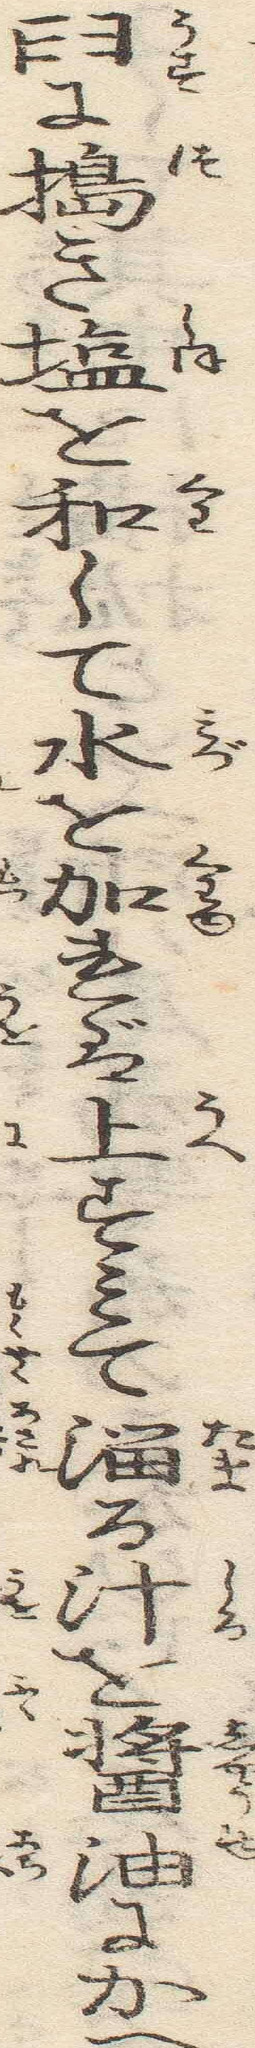臼に搗き塩を和して水を加れば上すみて溜る汁を醤油にかへ
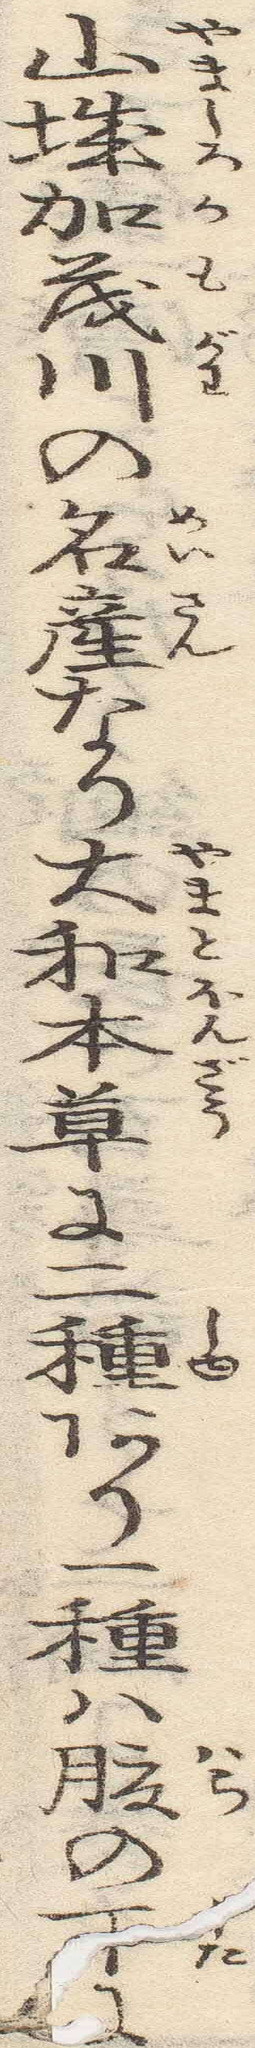山城加茂川の名産なり大和本草に二種あり一種は腹の下に
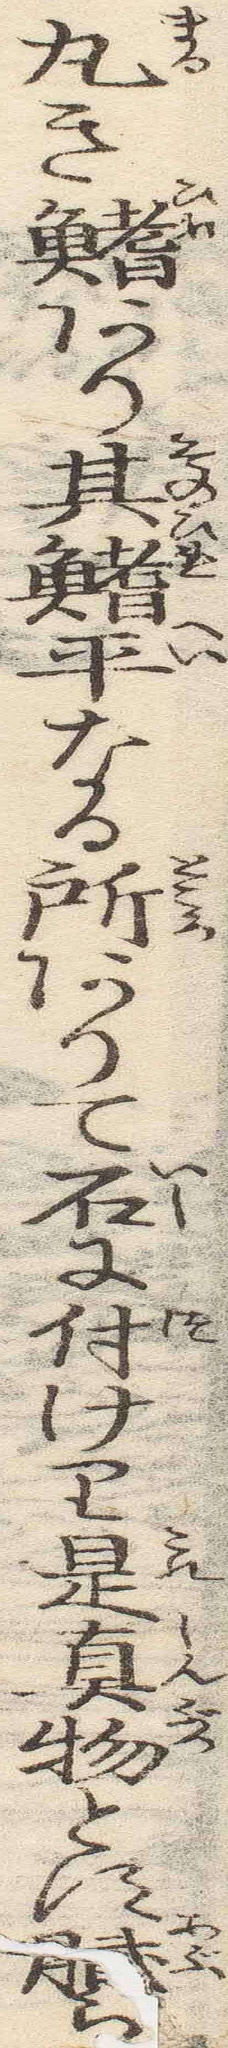丸き鰭あり其鰭平なる所ありて石に付けり是真物とす膩ら
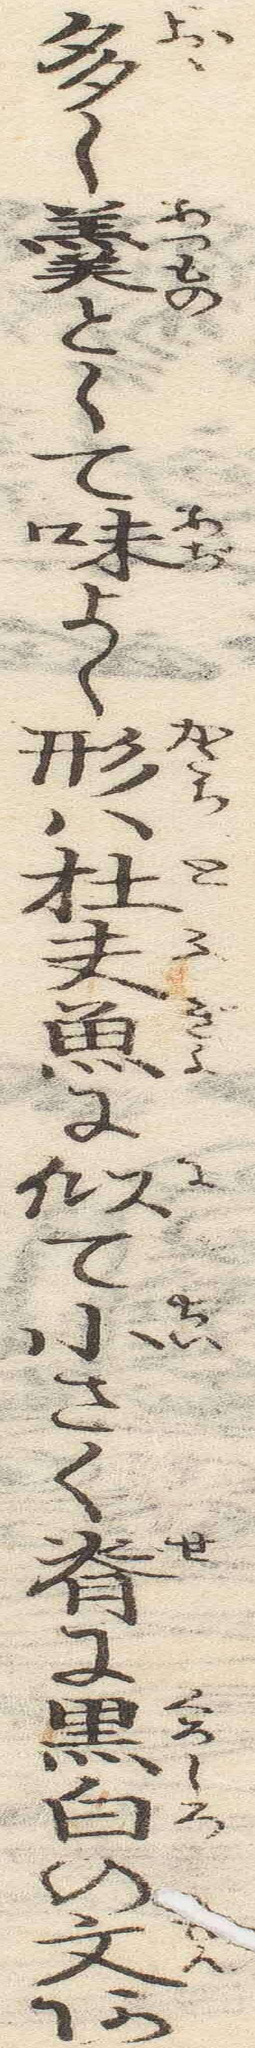多し羹として味よく形は杜夫魚に似て小さく脊に黒白の文あ
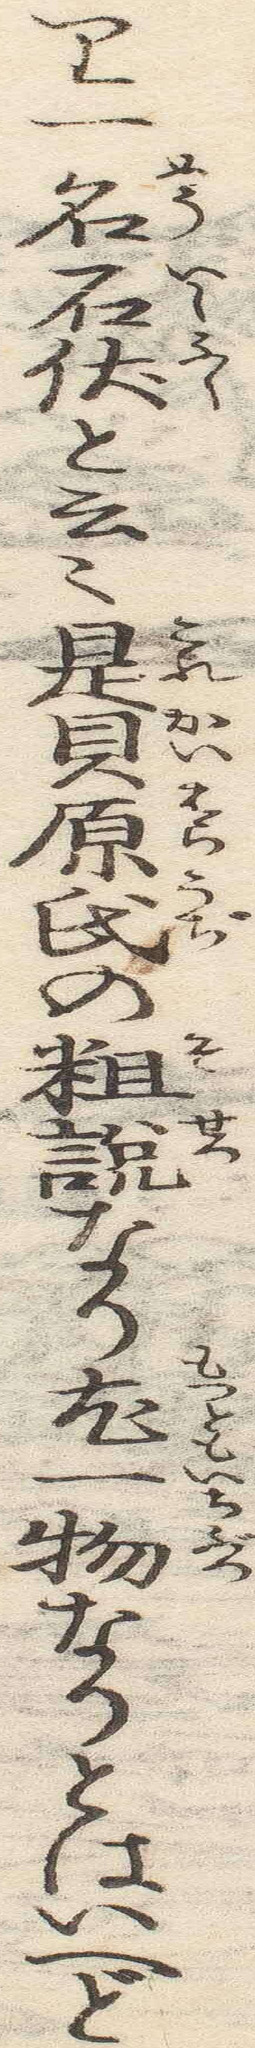り一名石伏と云々是貝原氏の粗説なり尤一物なりとはいへど
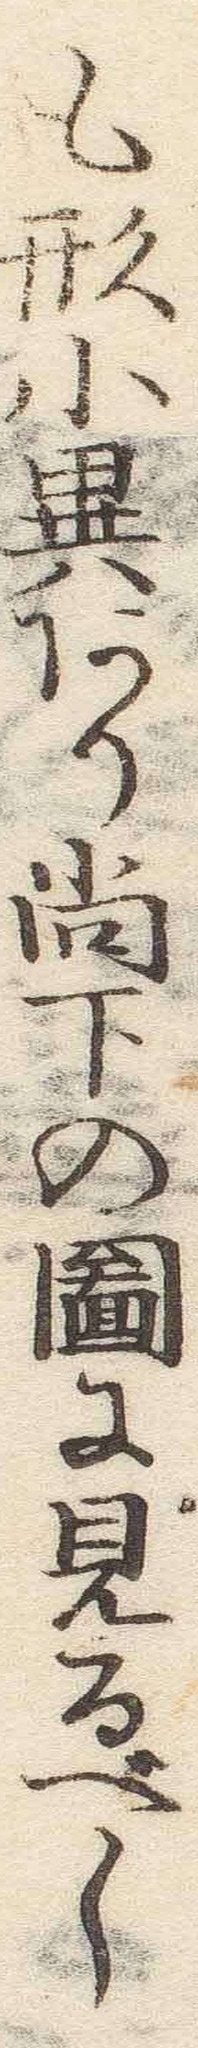も形小異あり尚下の図に見るべし
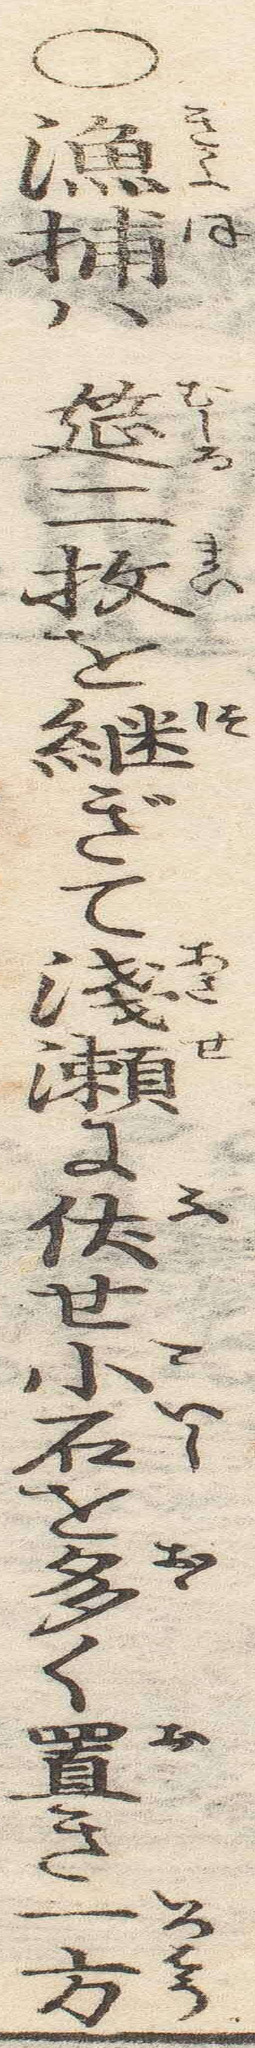○漁捕は筵二枚を継ぎて浅瀬に伏せ小石を多く置き一方
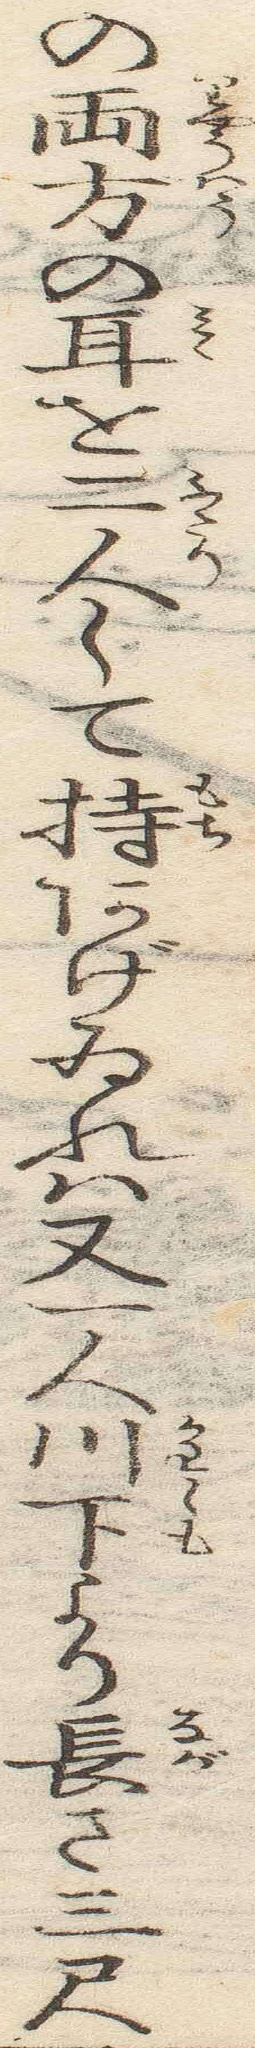の両方の耳を二人して持あげゐれは又一人川下より長さ三尺
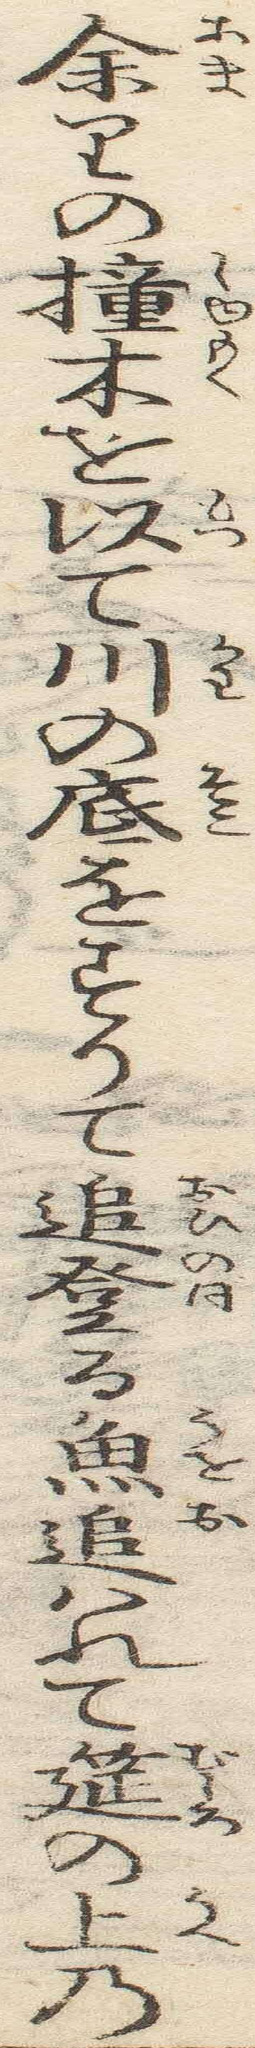余りの撞木を以て川の底をすりて追登る魚追はれて筵の上の
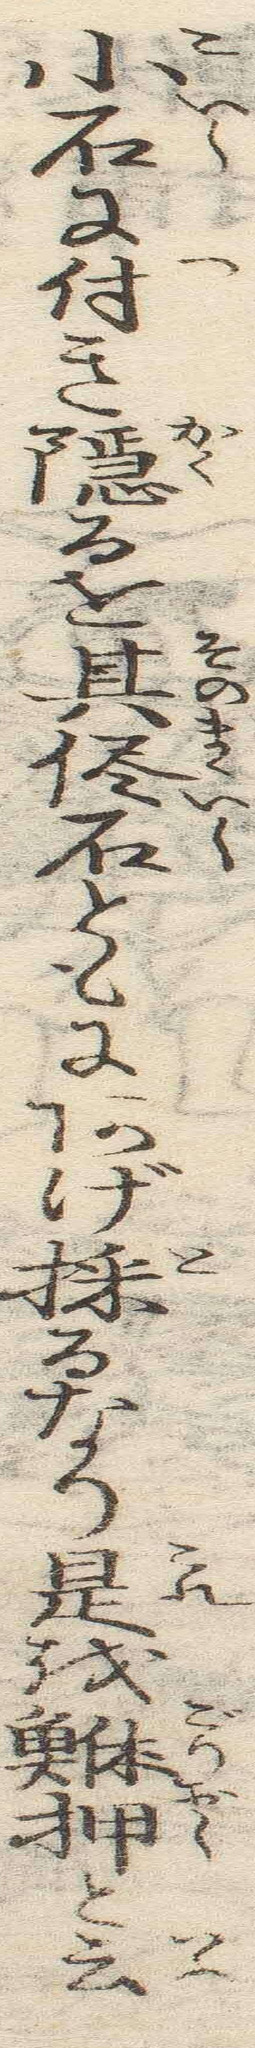小石に付き隠るを其侭石ともにあげ採るなり是を鮴押と云
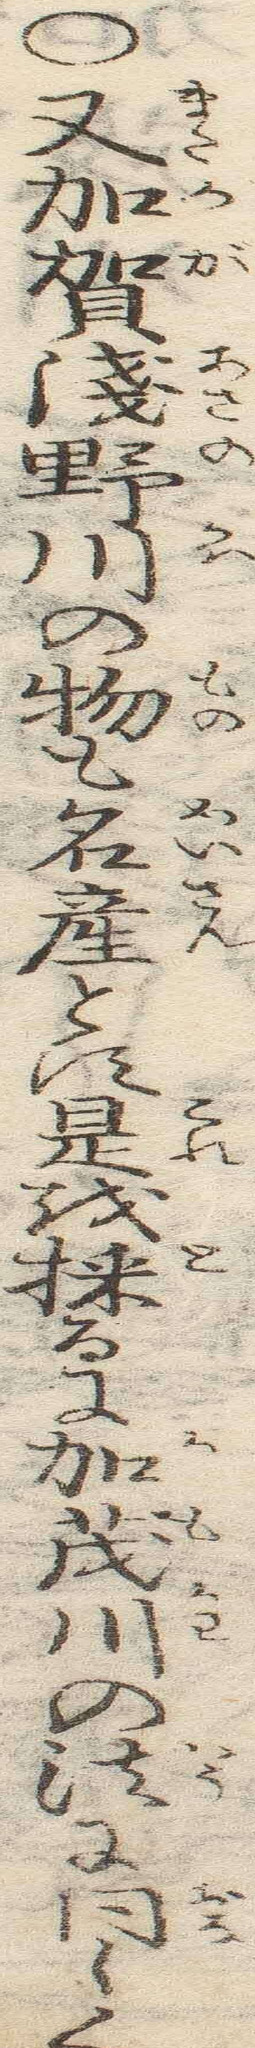○又加賀浅野川の物も名産とす是を採るに加茂川の法に同しく
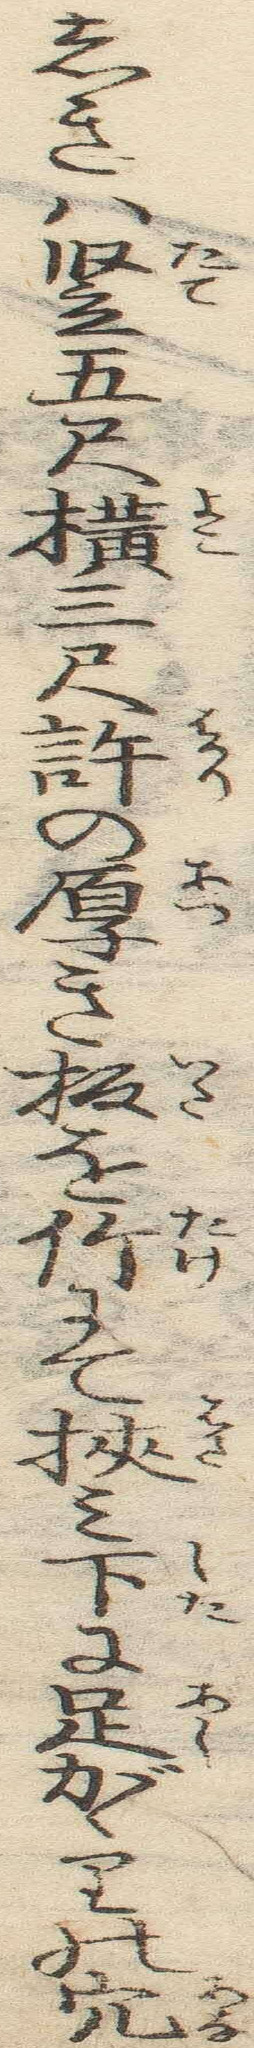しきは竪五尺横三尺許の厚き板を竹にて挟み下に足がゝりの穴
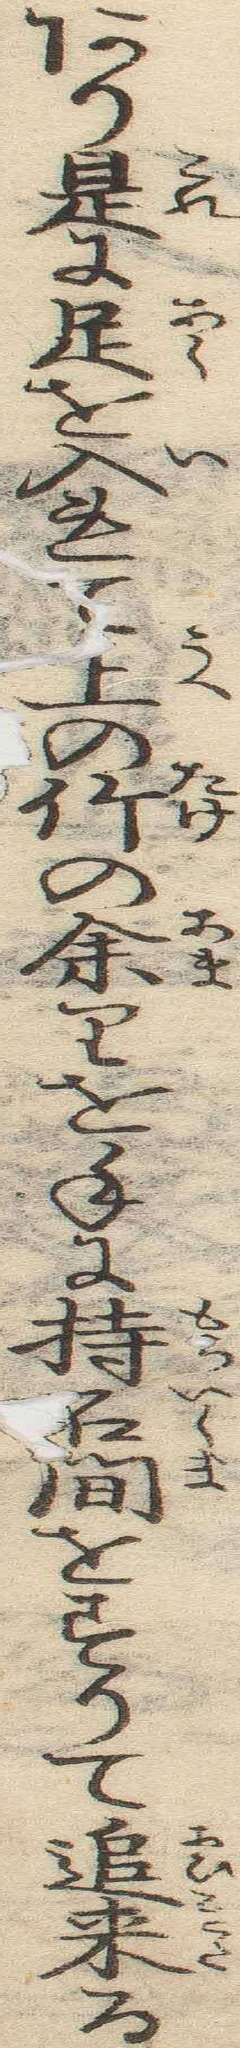あり是に足を入れて上の竹の余りを手に持石間をすりて追来る

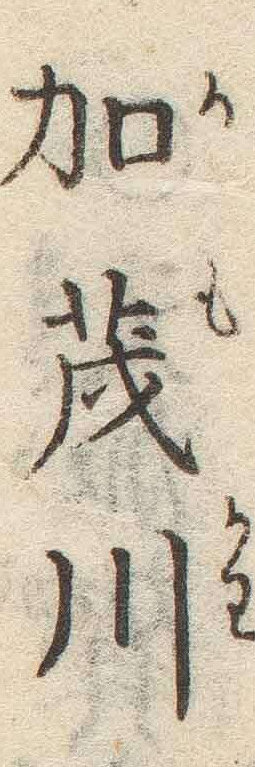加茂川

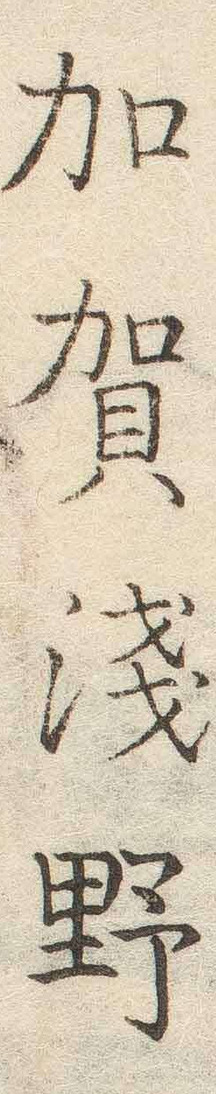加賀浅野
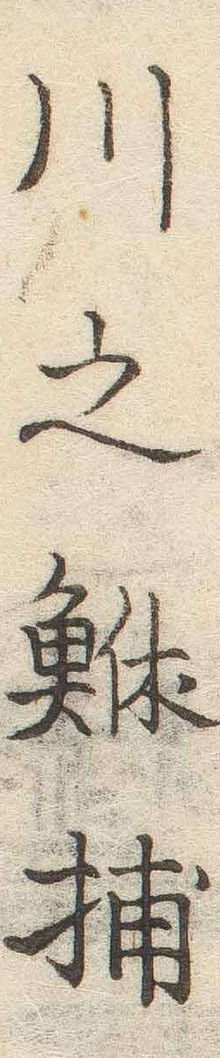川之鮴捕
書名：日本山海名産図会
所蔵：東京学芸大学附属図書館 国文学研究資料館
